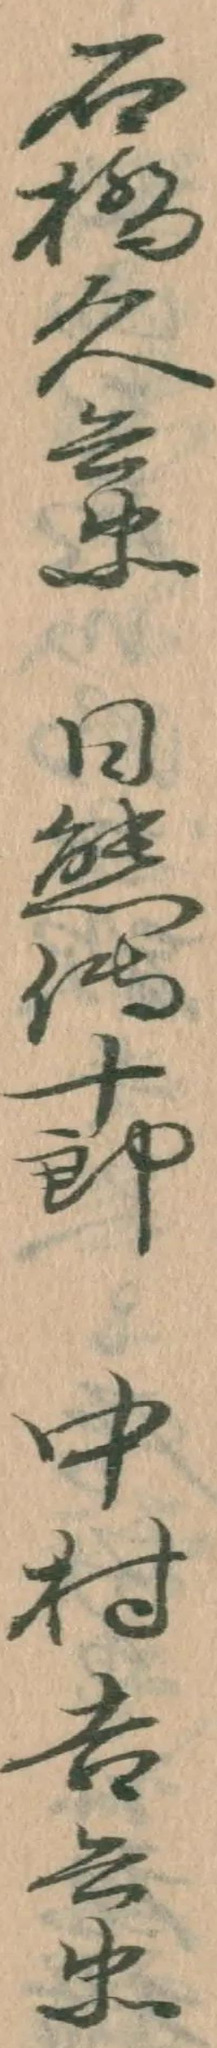石橋久兵衛日熊伝十郎中村吉兵衛
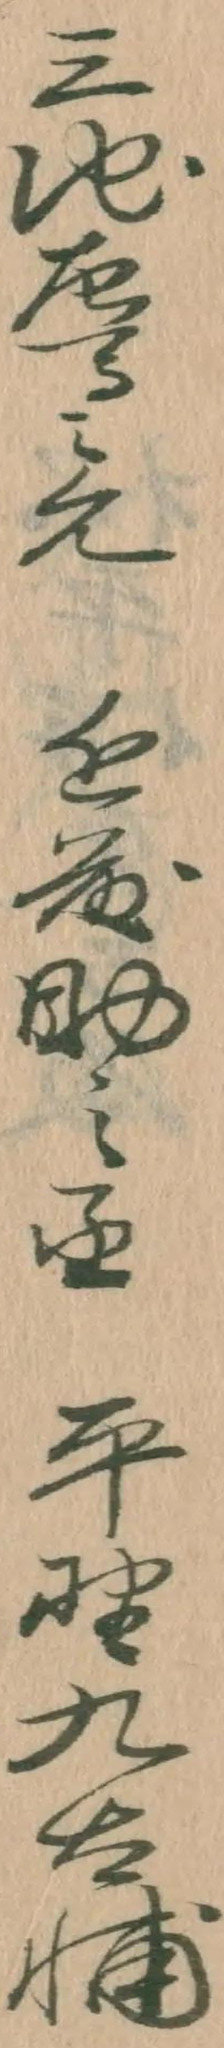三池左馬之允近藤助之丞平野九太輔
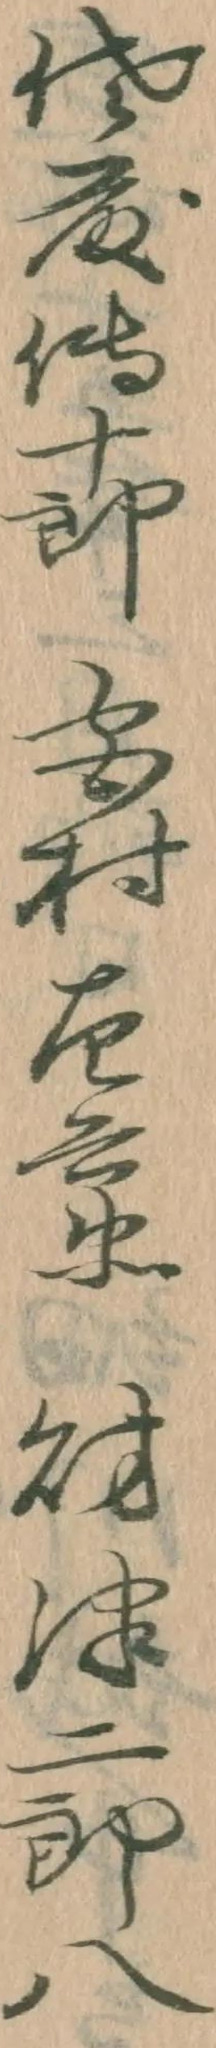佐藤伝十郎宮村左兵衛財津二郎八
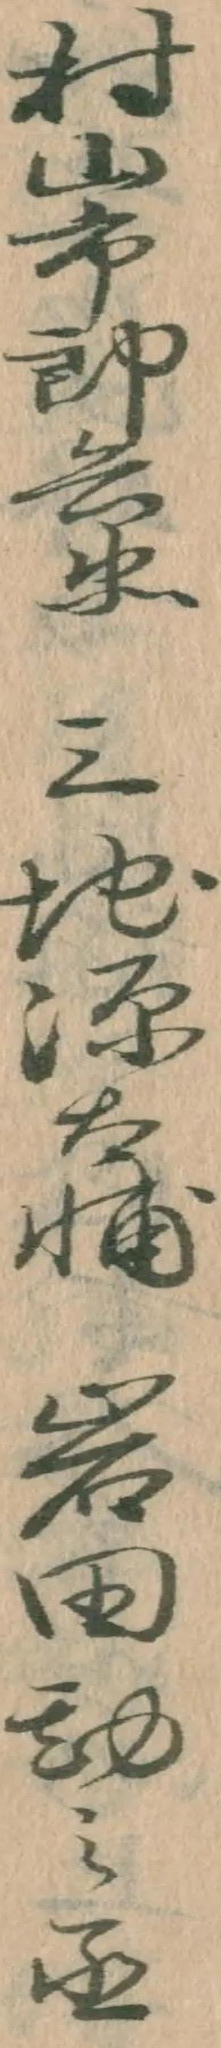村山市郎兵衛三池源太輔岩田勘之丞
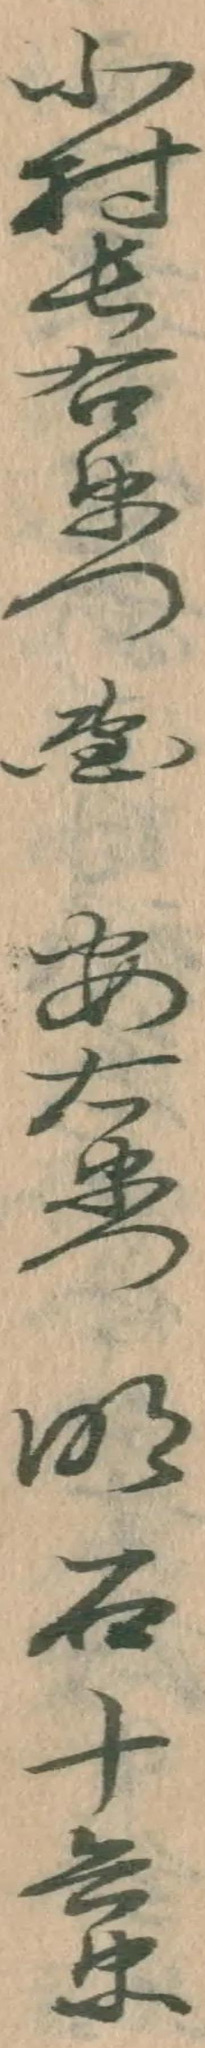北村長右衛門團安右衛門明石十兵衛
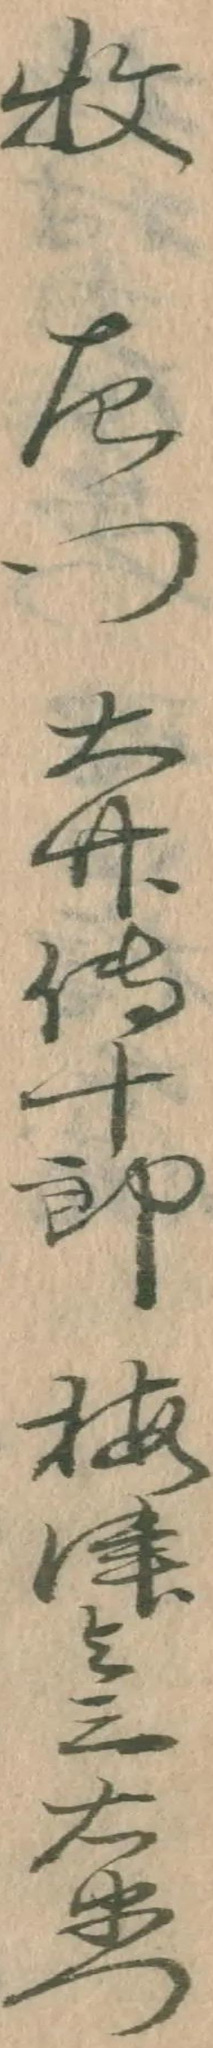牧左門大竹伝十郎梅津与三右衛門
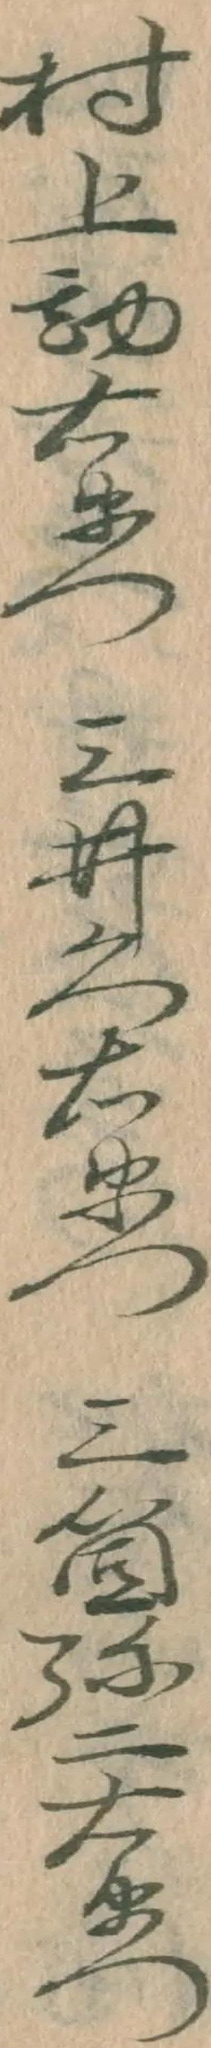村上勘右衛門三井久右衛門三箇弥二右衛門
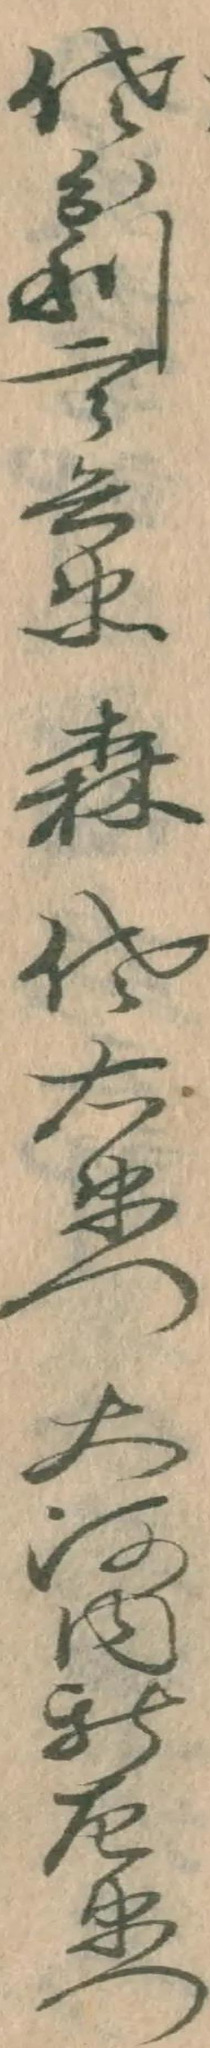佐分利二郎兵衛森佐右衛門大河内新左衛門
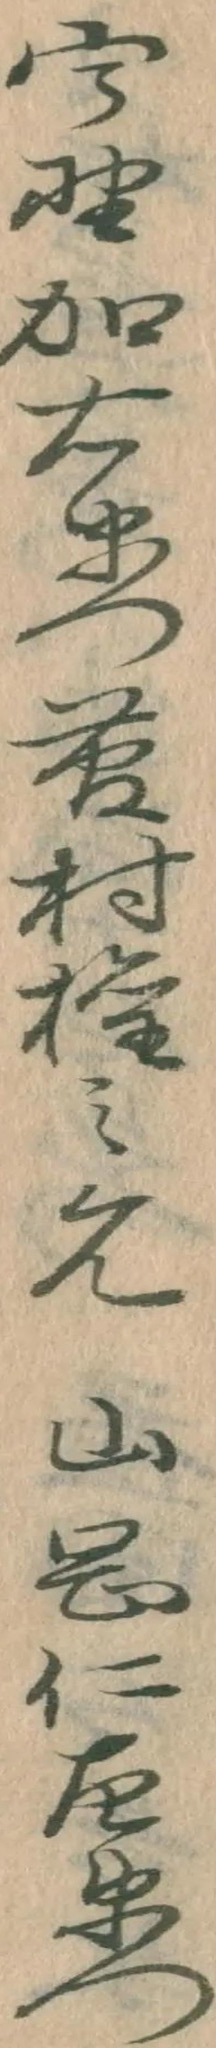宇野加右衛門菅村権之允山岡仁左衛門
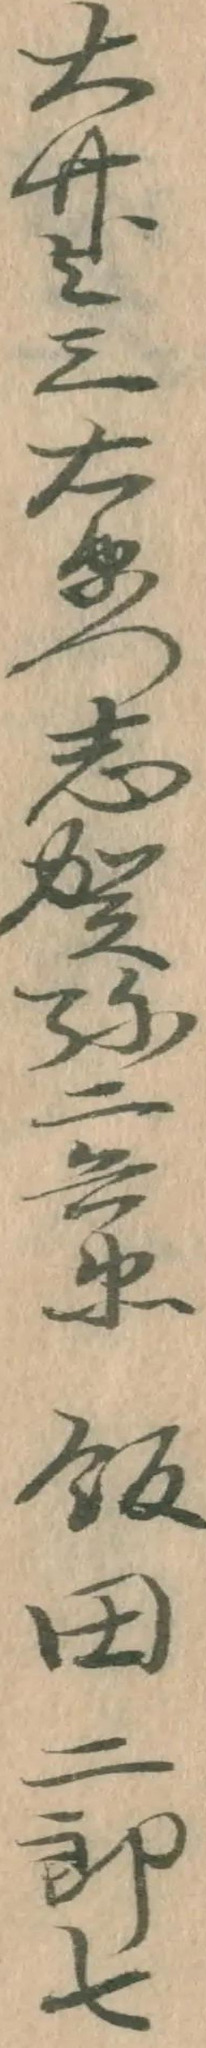大竹与三右衛門志賀弥二兵衛飯田二郎七
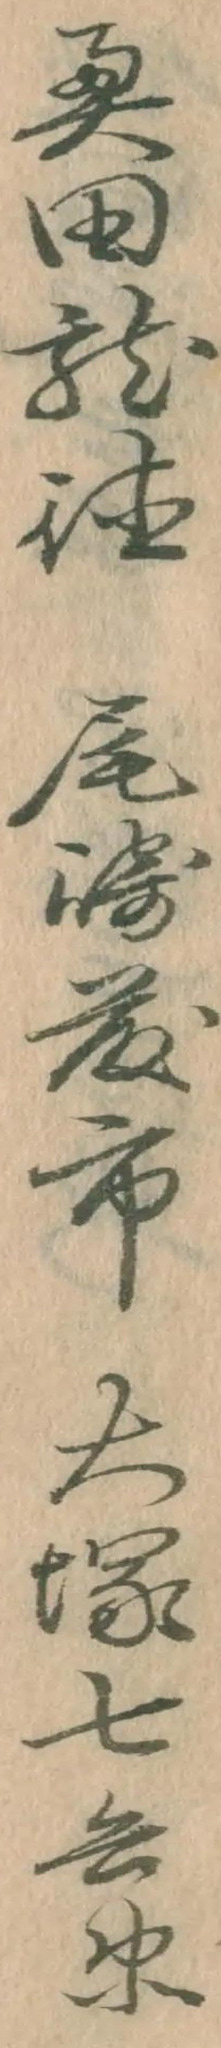奥田龍徳尾崎藤市大塚七兵衛

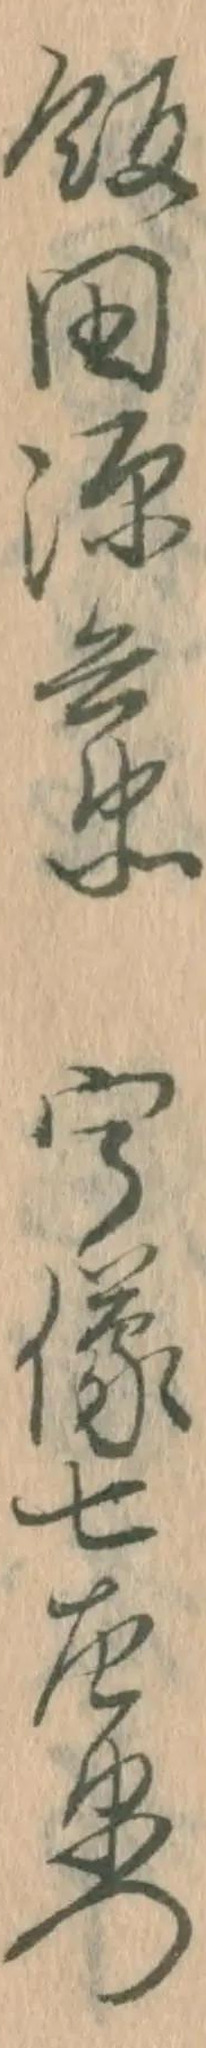飯田源兵衛宇像七左衛門
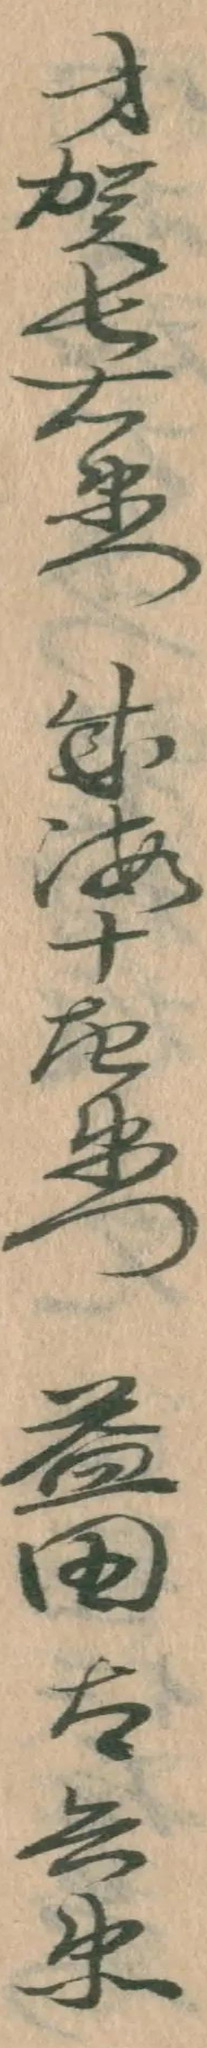才賀七右衛門成海十左衛門益田太兵衛
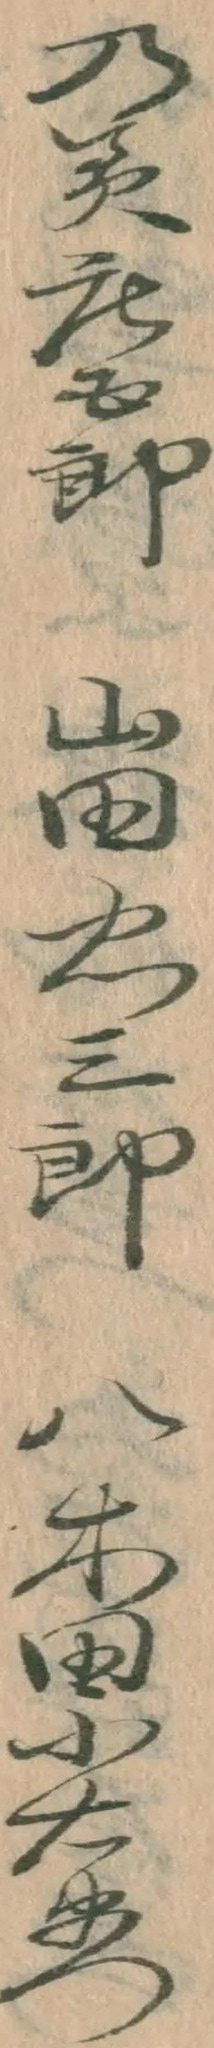乃美庄五郎山田忠三郎八木田小右衛門
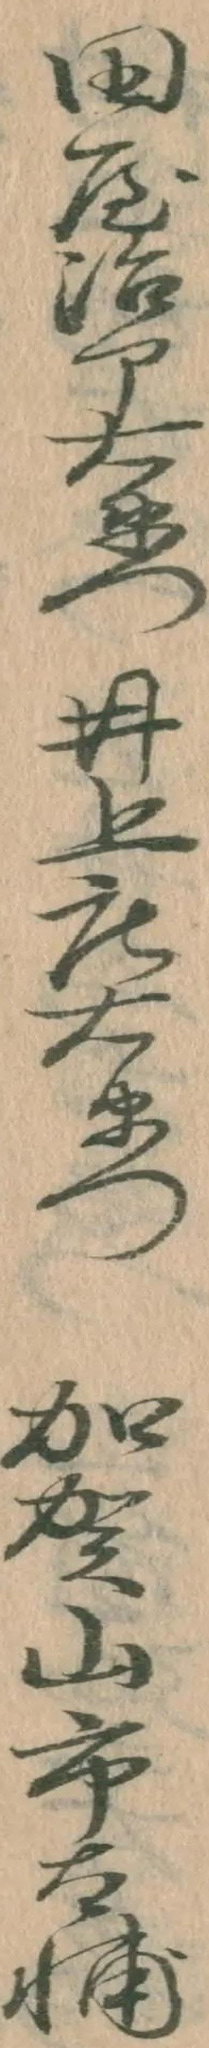田屋治部右衛門井上庄右衛門加賀山市太輔
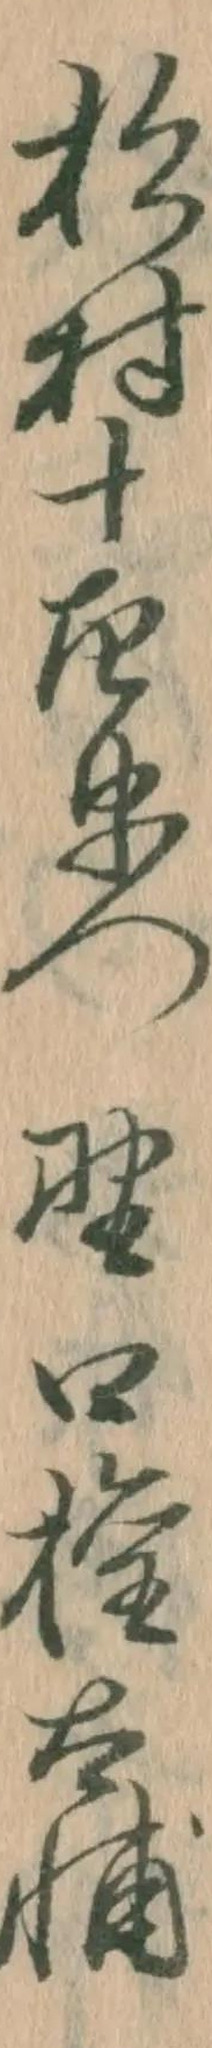杉村十左衛門野口権太輔
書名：切支丹御退治記 49巻. [9]
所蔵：国立国会図書館 National Diet Library, JAPAN
